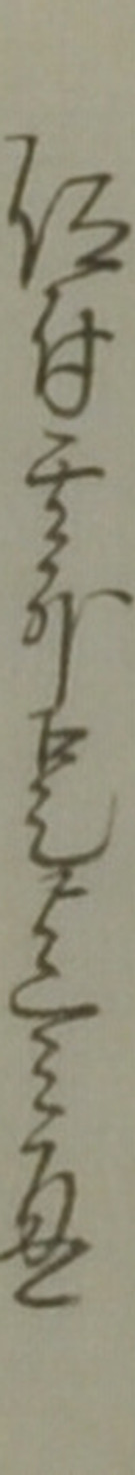仰付其外是迄之通
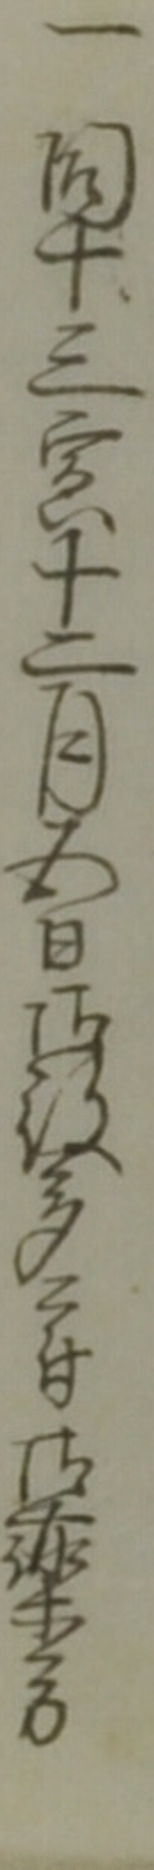一同十三寅十二月五日御役多ニ付御薬方
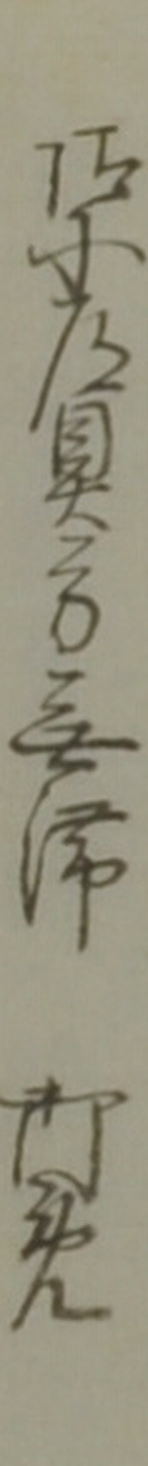御小道具方無滞御免
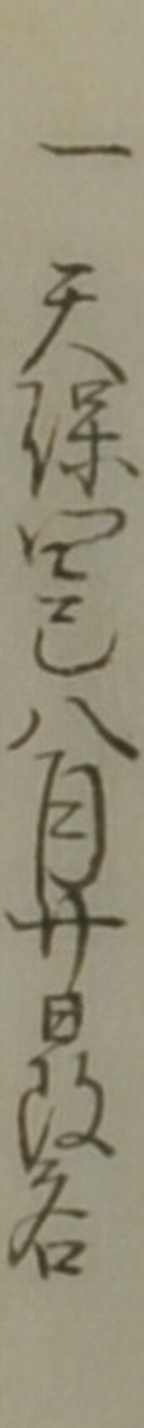一天保四巳八月廿日改名
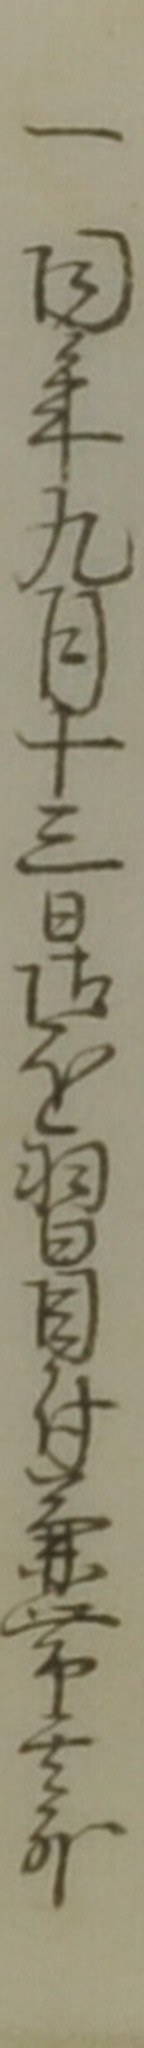一同年九月十三日御近習目付兼帯其外
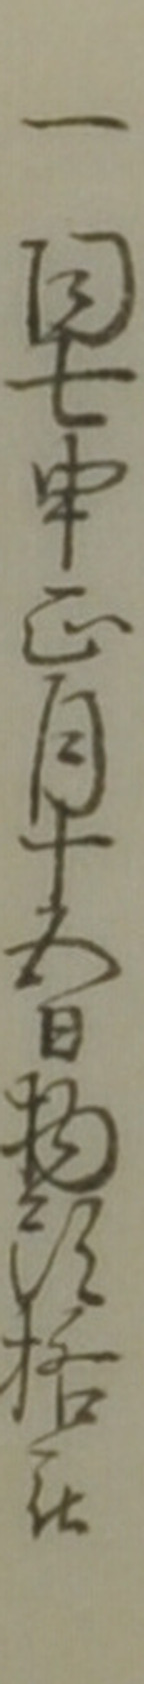一同七申正月十五日物頭格被
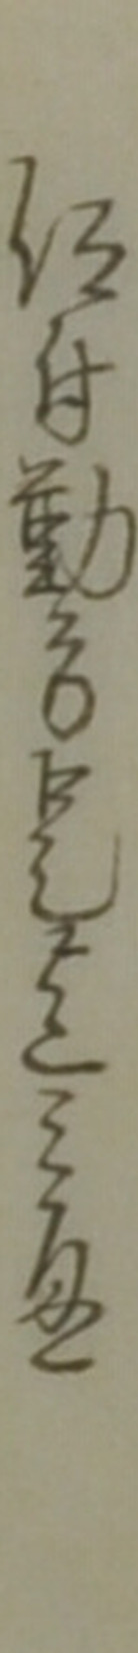被仰付尤勤方是迄之通
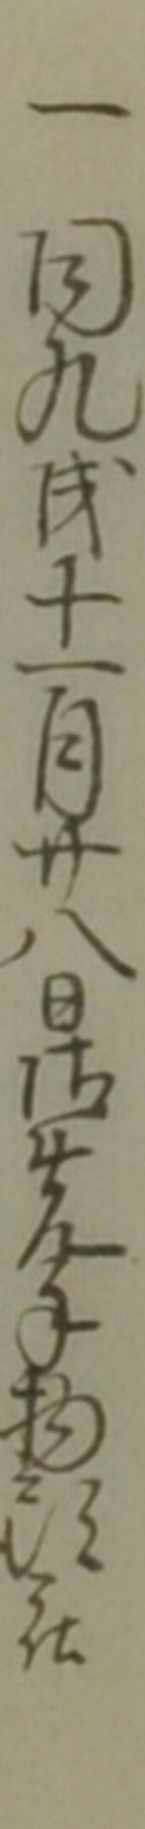一同九戌十一月廿八日御先手物頭被
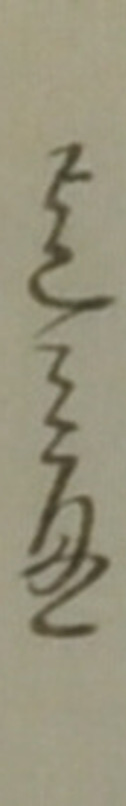迄之通
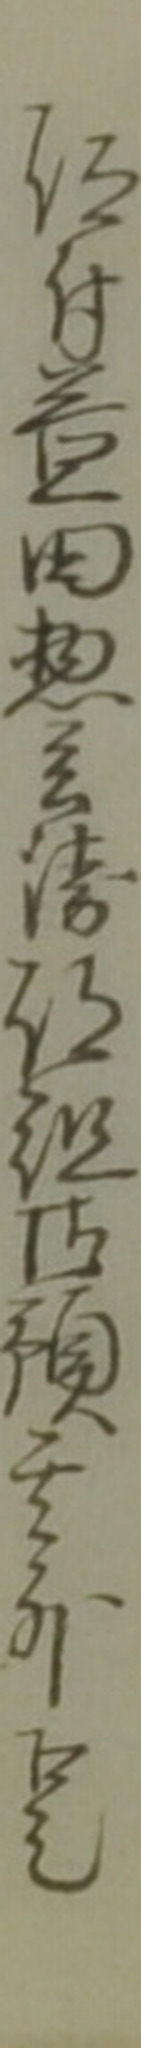仰付益田惣兵衛跡組御預其外是
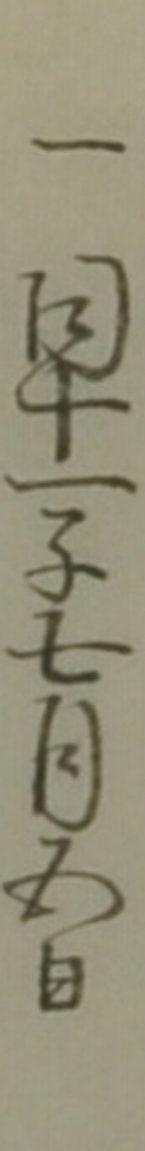一同十一子七月五日
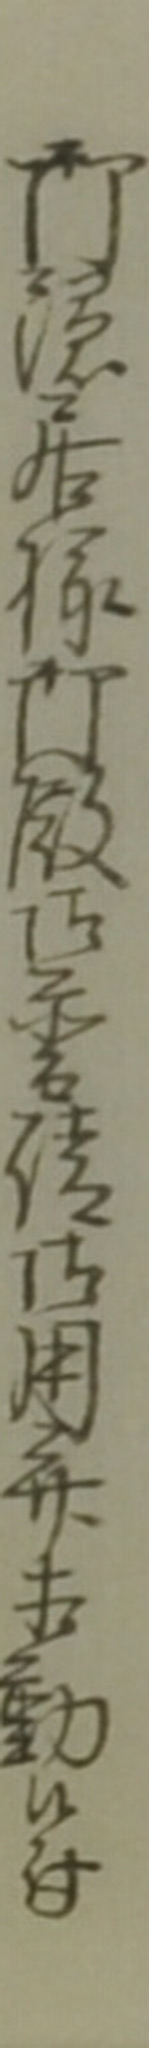御隠居様御殿御普請御用弁相勤候付
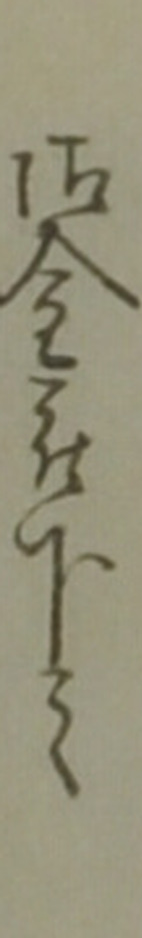御金被下之
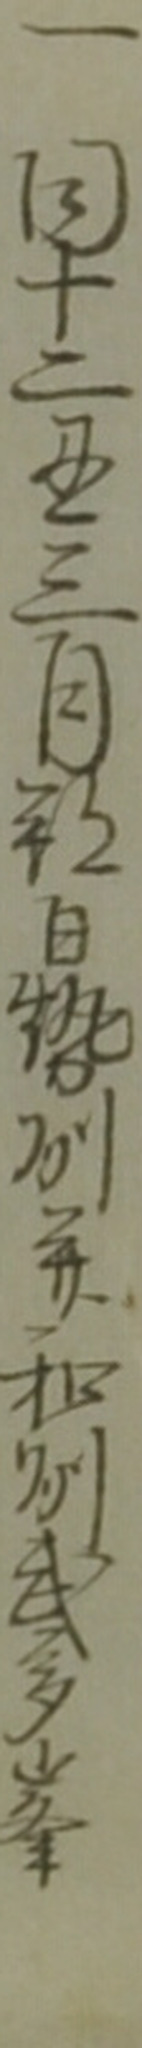一同十二丑三月朔日勢州幷和州武多峰
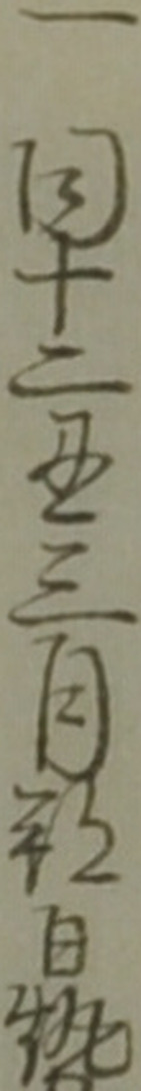一同十二丑五月十八日
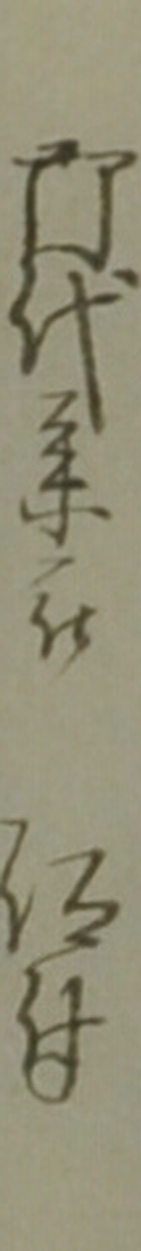御代参被仰付
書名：給人諸士勤仕録（三）
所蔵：伊那市立高遠町図書館・合同会社AMANE
